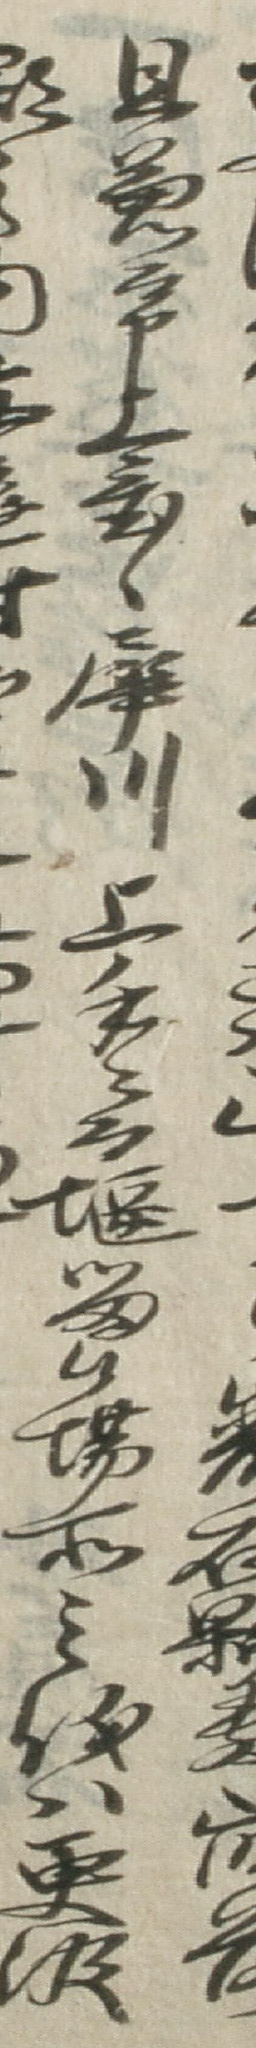且兼而申上置候犀川上手二而堤留候場所之儀ハ更級
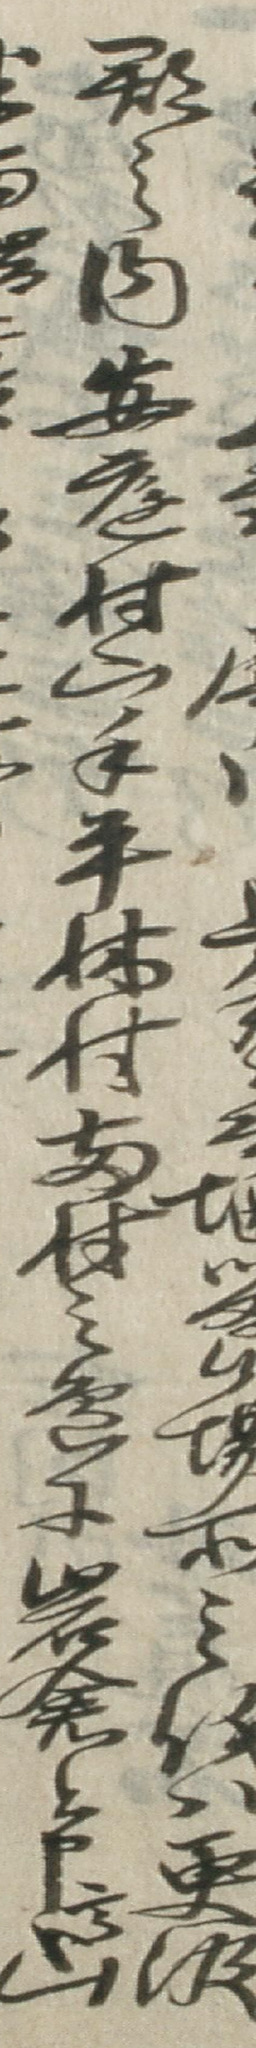郡之内安庭村山手平林両村之辺と岩倉と申高山
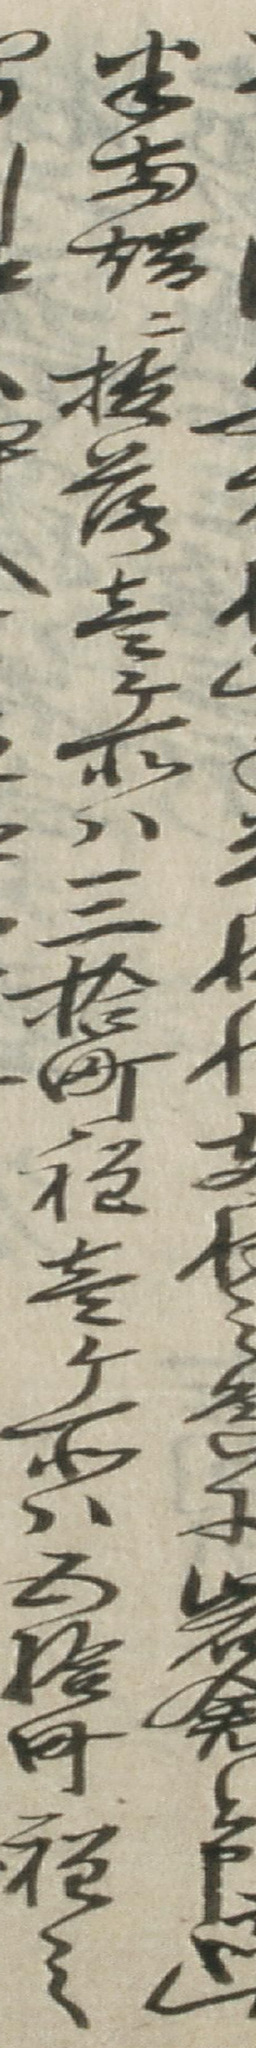半両端二抜落壱ヶ所ハ三拾町程壱ヶ所ハ五拾町程之
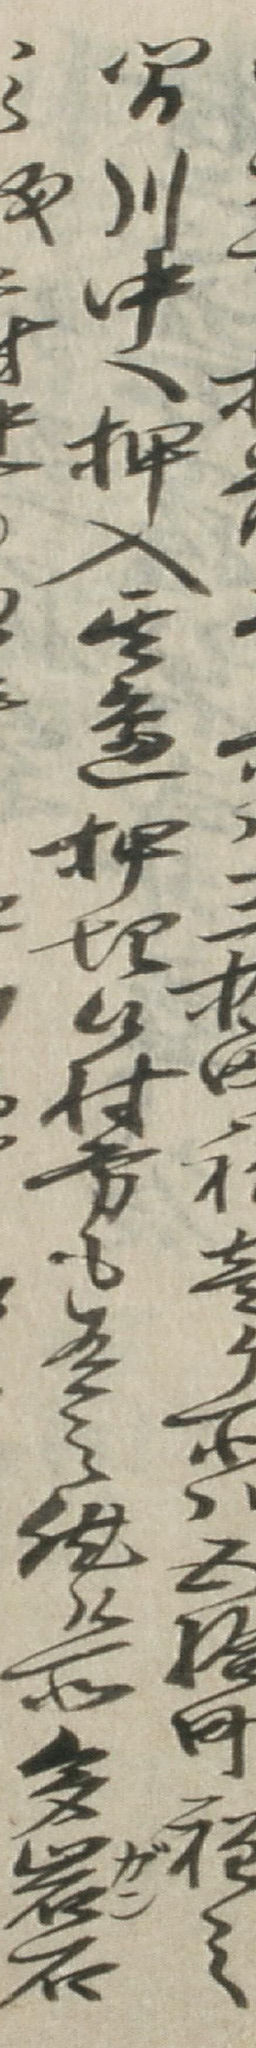間川中ㇸ押入其辺押埋候村方も有之然ㇽ所多岩石
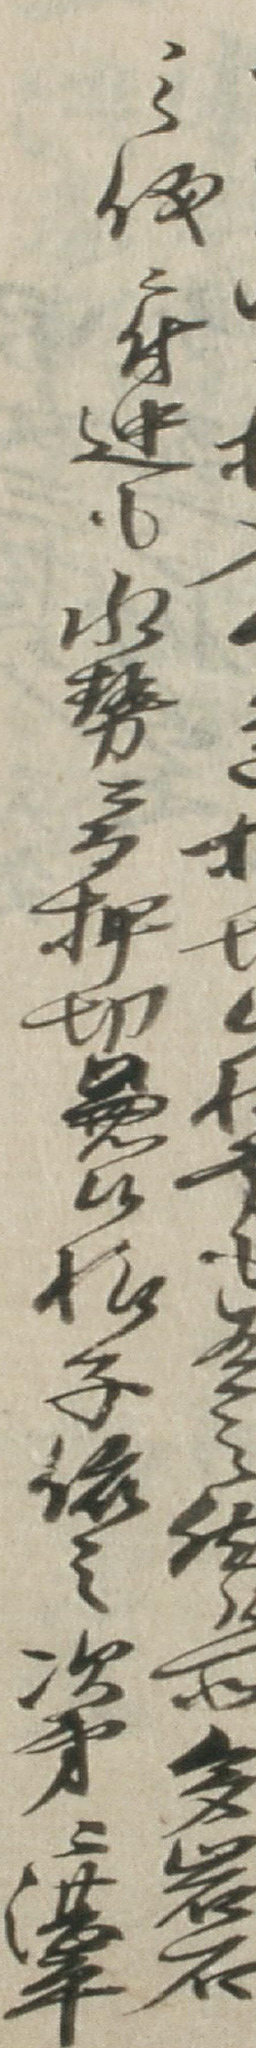之儀二付迚も水勢二而押切兼候様子之次第二湛平
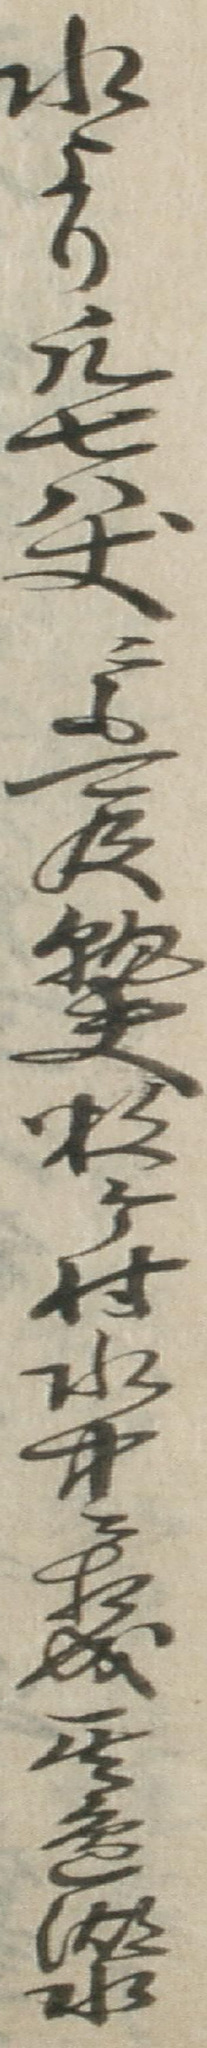水より凡七八丈二も可及就夫数ヶ村水中二相成其辺湖水
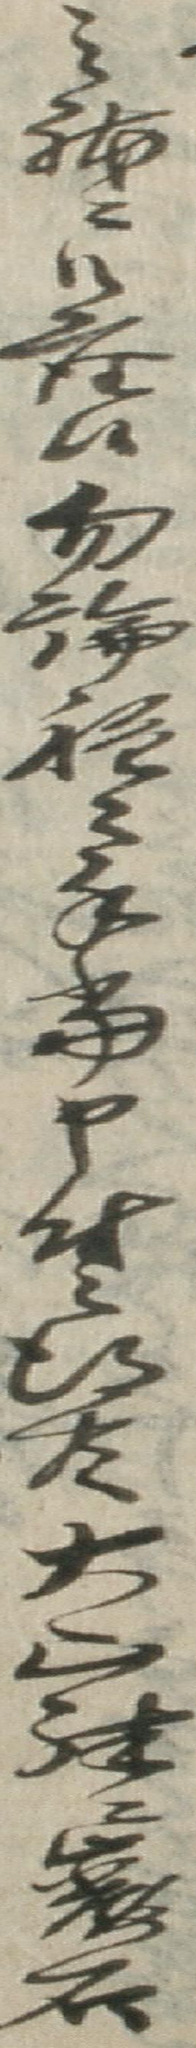之躰二御座候勿論種々手当申付候得共大山殊二巌石
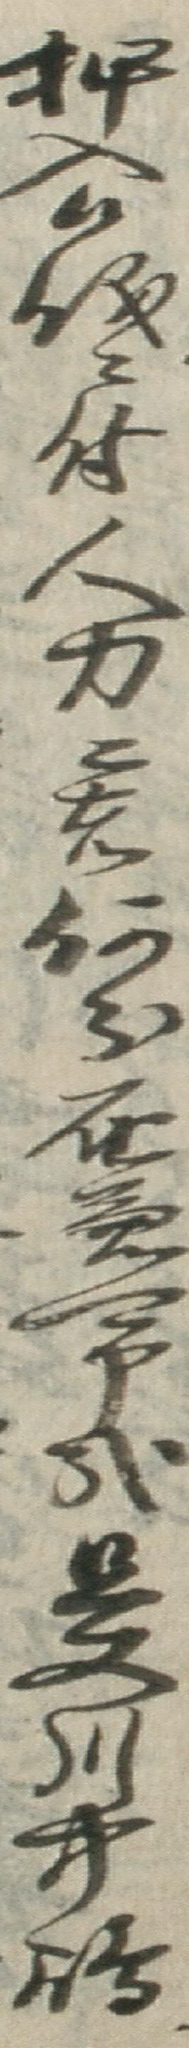押入候儀二付人力二ハ何分届兼可申哉且又川中嶋
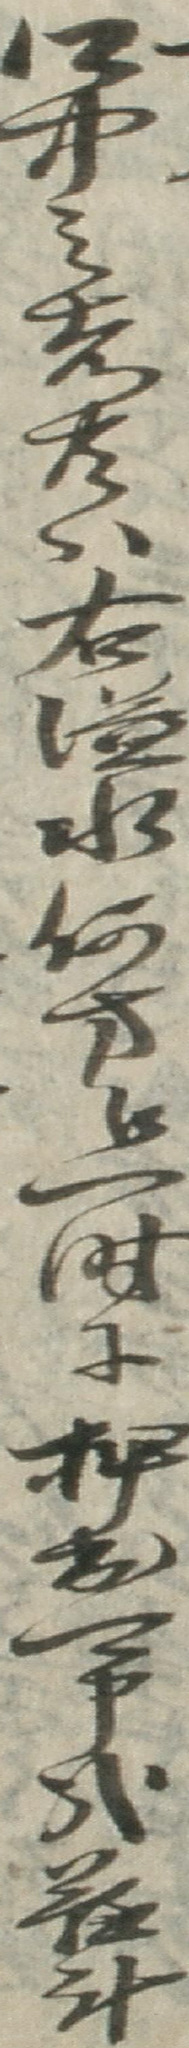郷中之者共ハ右湛水何方江一時に押出可申哉難計
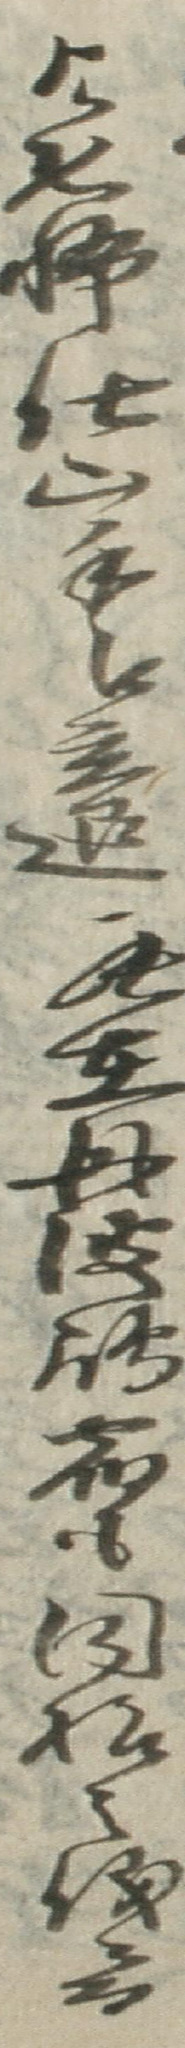と恐怖仕山手江立退罷在丹波嶋宿も同様之儀二而
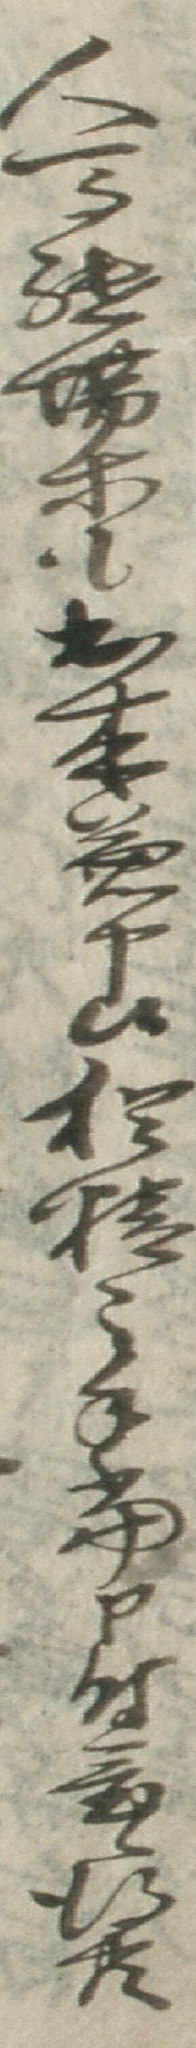人馬継場等も出来兼申候程精々手当申付置候得共
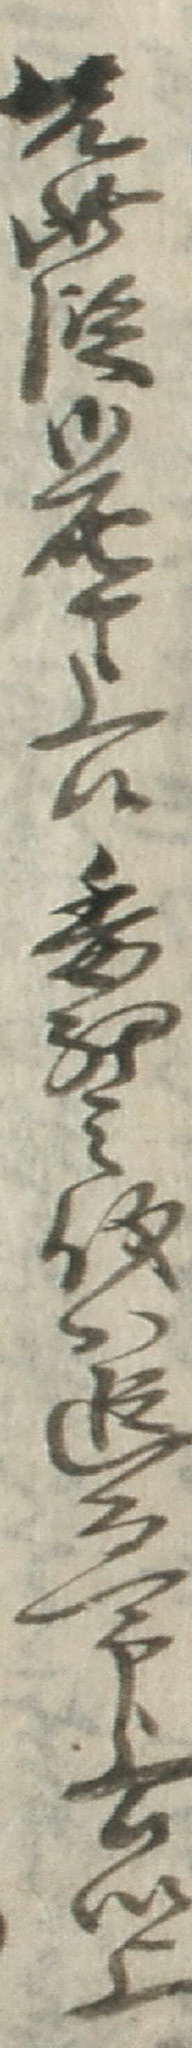先此段御届申上候委細之儀は追而可申上候以上
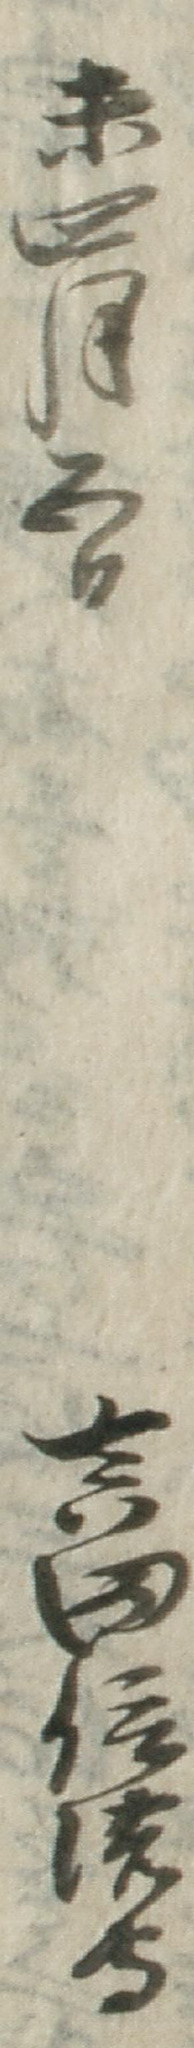未四月五日真田信濃守
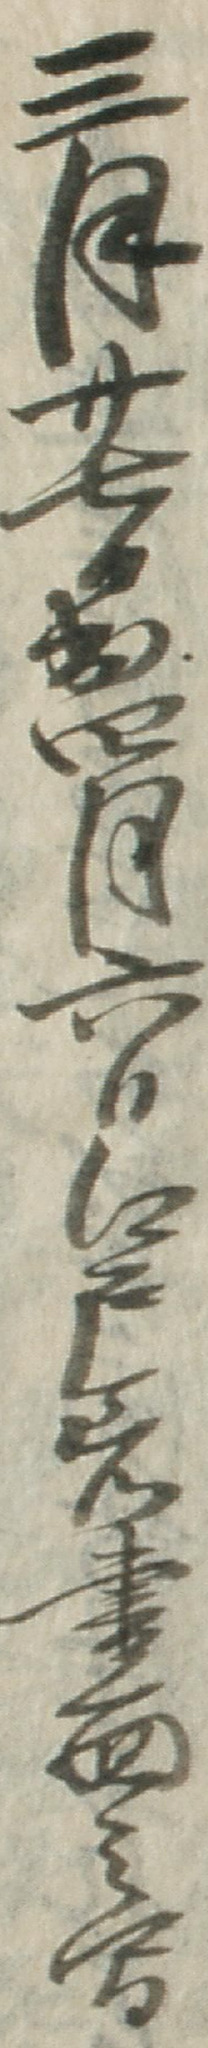三月廿七日出四月六日江戸着書面之写
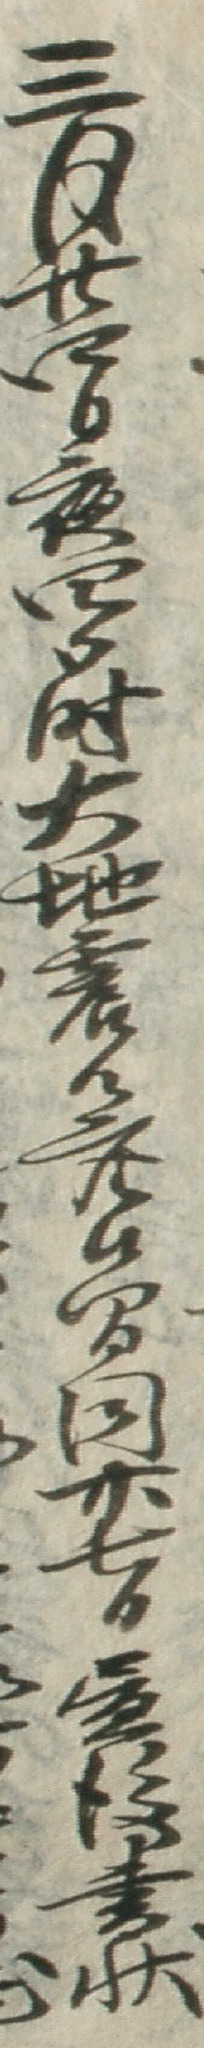三月廿四日夜四ッ時大地震御座候間廿七日昼後書状
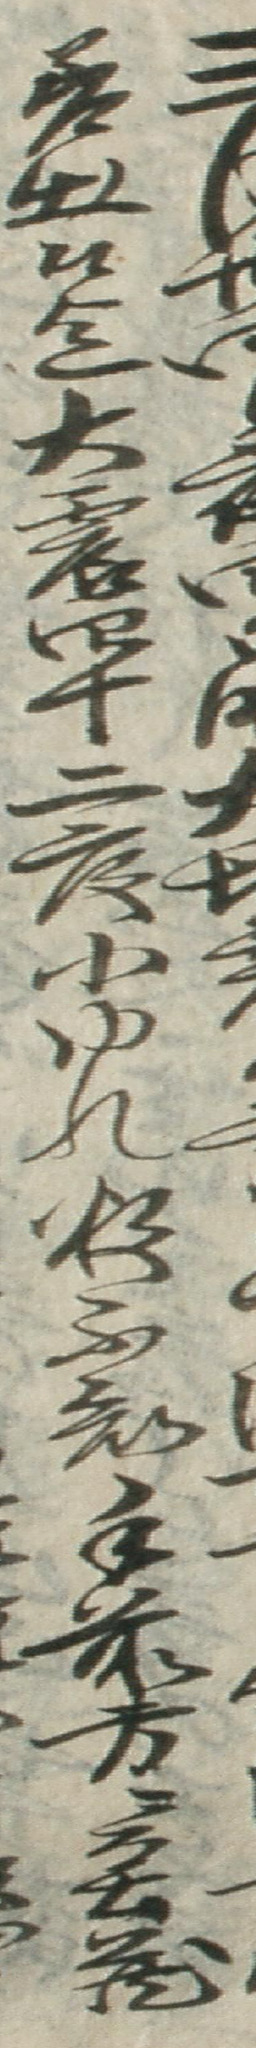差出候迄大震四十二度小ゆれ数不知手前方二而土蔵
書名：信濃國地震實録記
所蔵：東京大学地震研究所図書室 Earthquake Research Institute Library, The University of Tokyo, JAPAN
